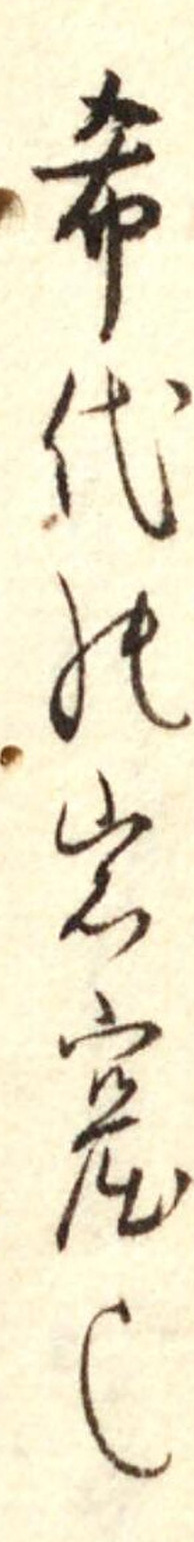希代の岩窟也
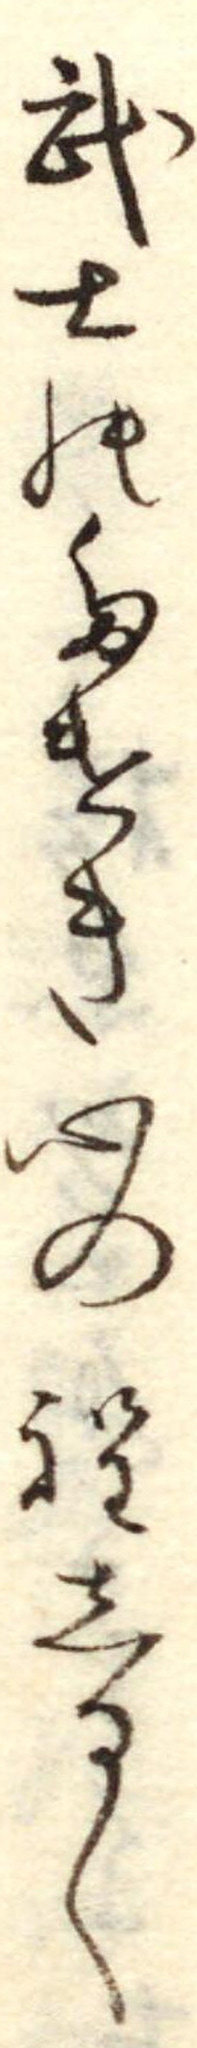武士のたけき心の程しるし
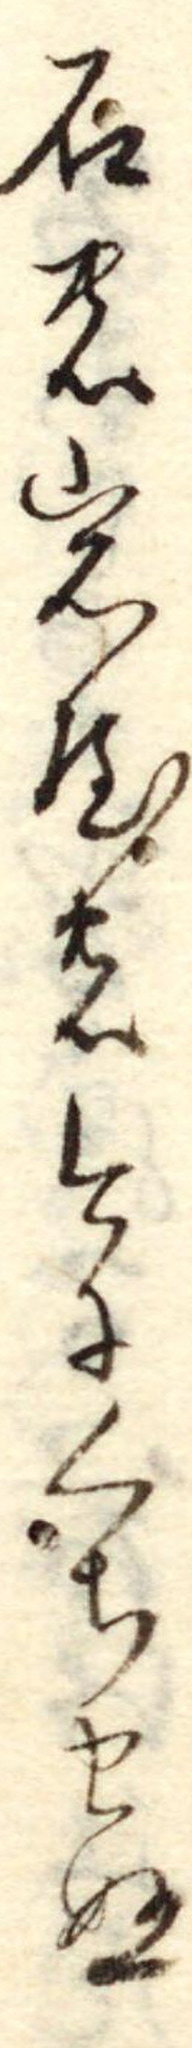石の岩屋の今にくちせぬ
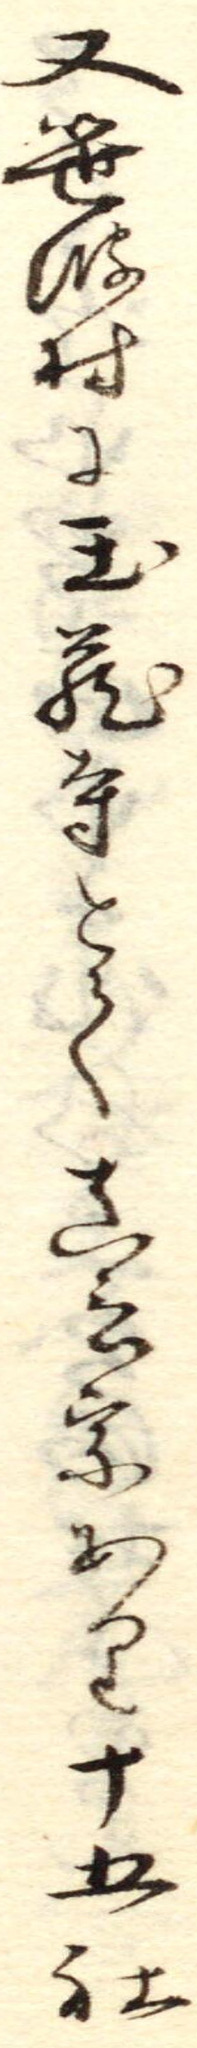又笹波村に玉蔵寺とて真言宗あり十五社
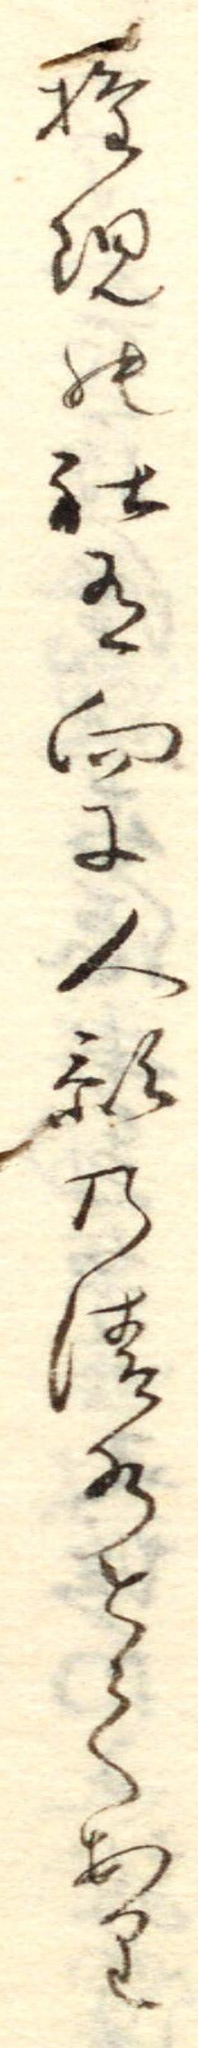権現の社有向に人影の清水とてあり
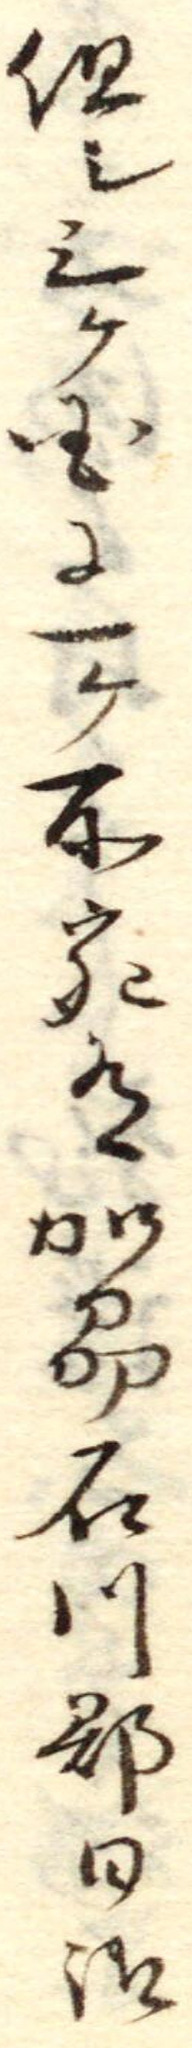但し三ヶ国に一ヶ所宛有加州石川郡比日御
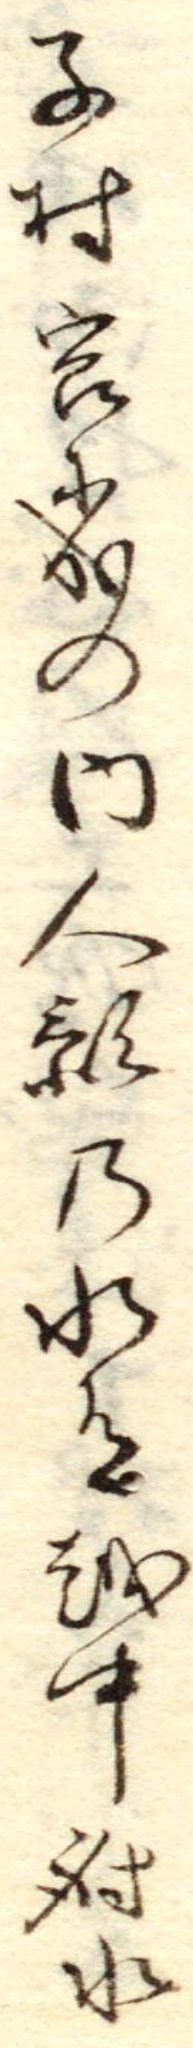子村宮森の内人影の水有越中射水
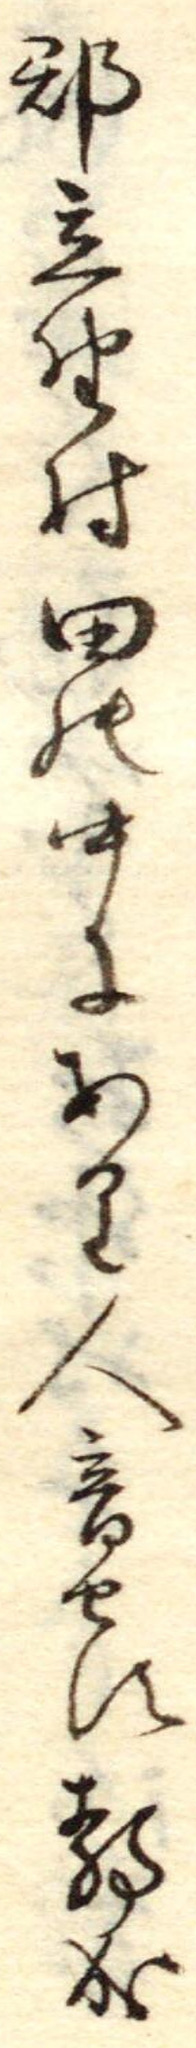郡立野村田の中にあり人音せす静成
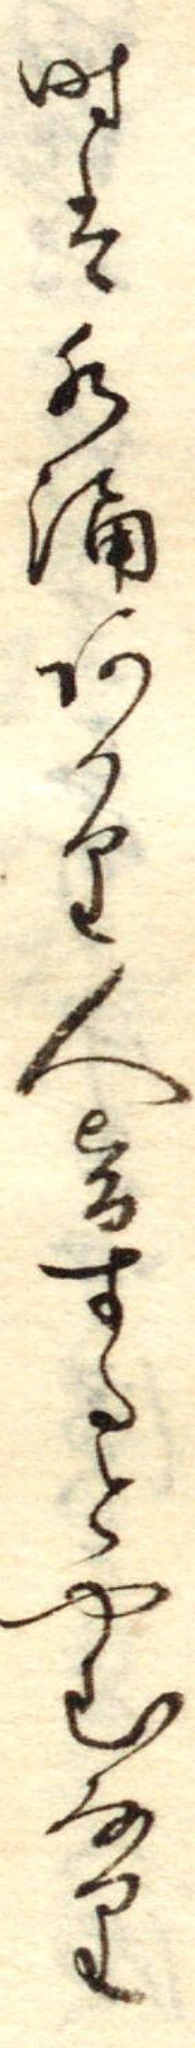時は水涌あかり人音するとやむなり

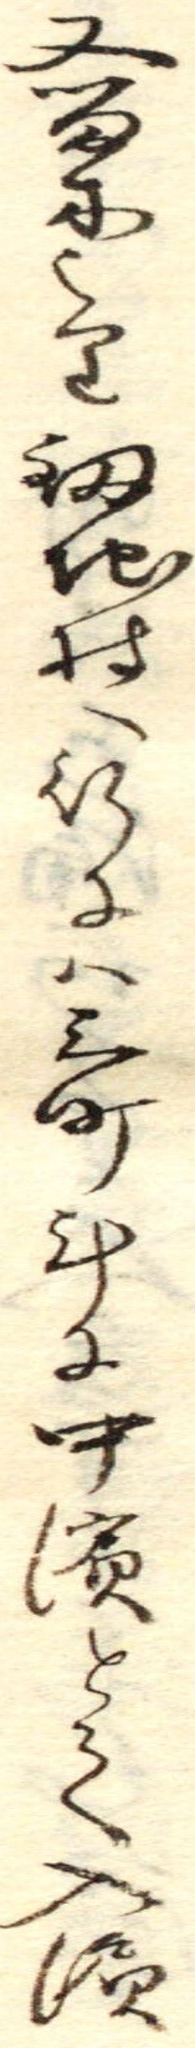又留木之里釼地村へ行には三町計に中浜とて入浜
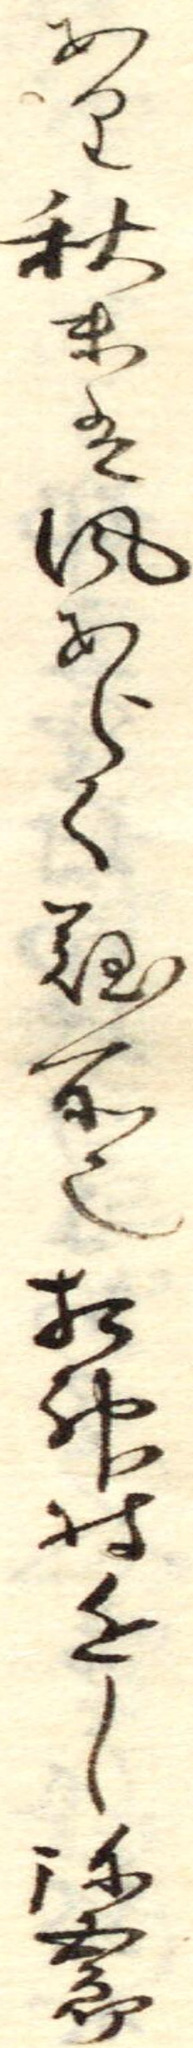あり秋末は風あらく難所也相神村近し弥五郎
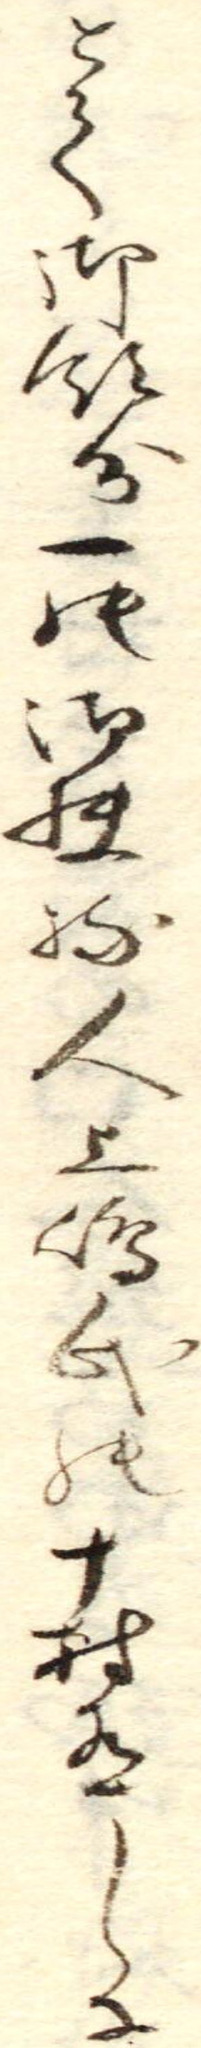とて御領分一の御扶持人上嶋氏の十村有しに
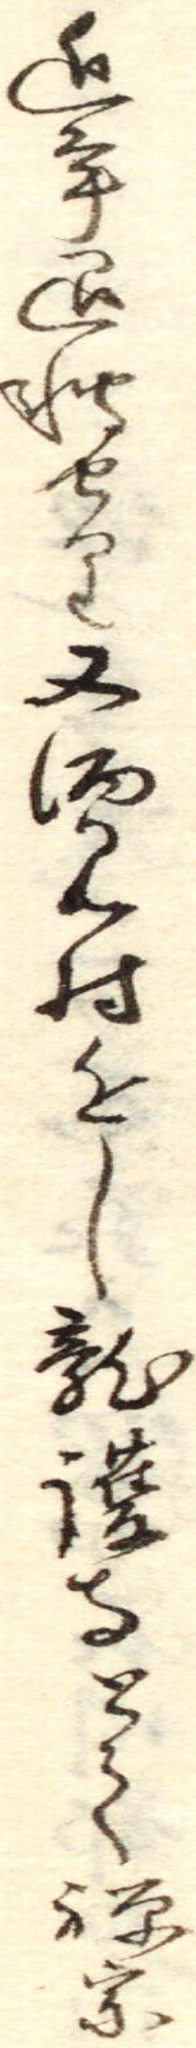近年退転せり又酒見村近し龍護寺とて禅宗
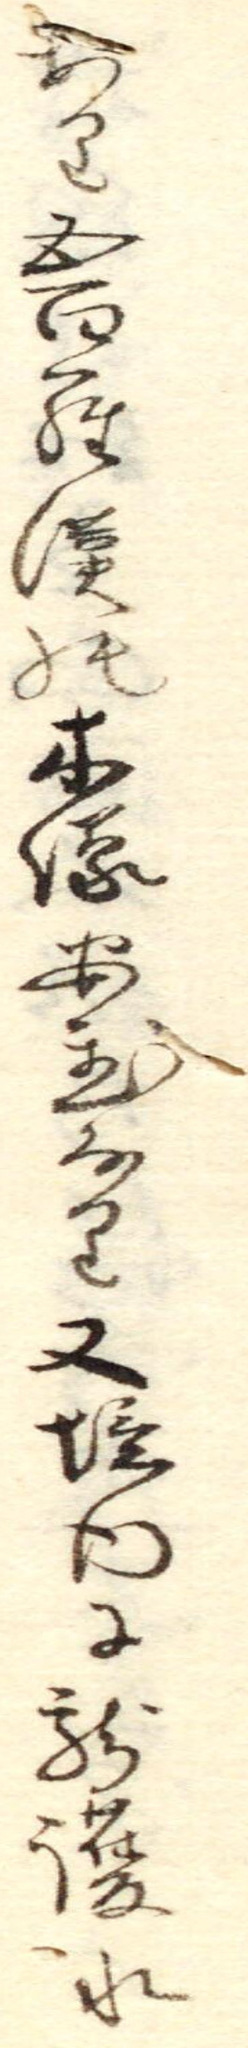あり五百羅漢の木像安置なり又境内に龍護水
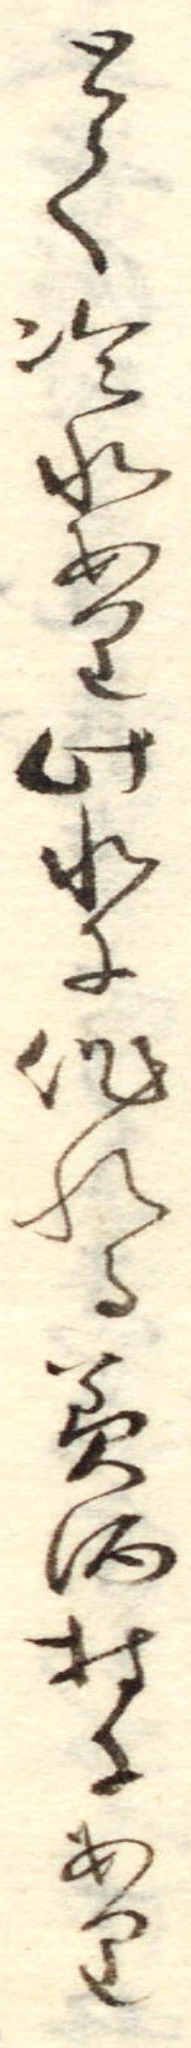とて冷水あり此水に作れる美酒村にあり
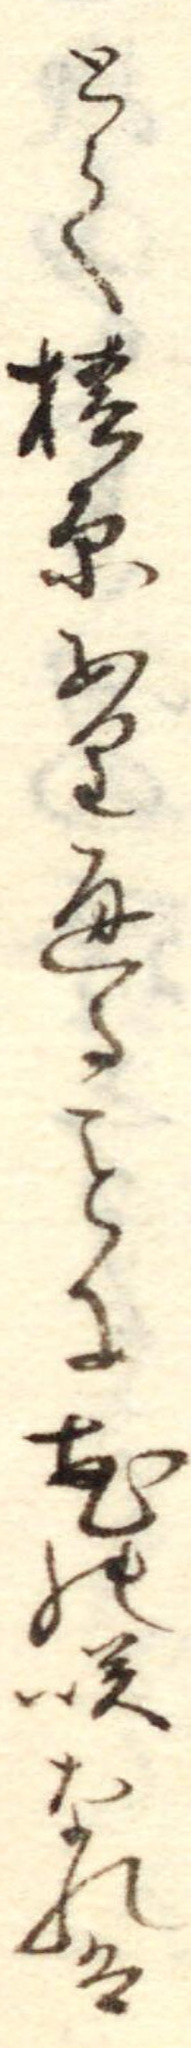とて椿原あり通ることに花の咲なれは
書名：能登名跡誌
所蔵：Ishikawa Prefectural Library
